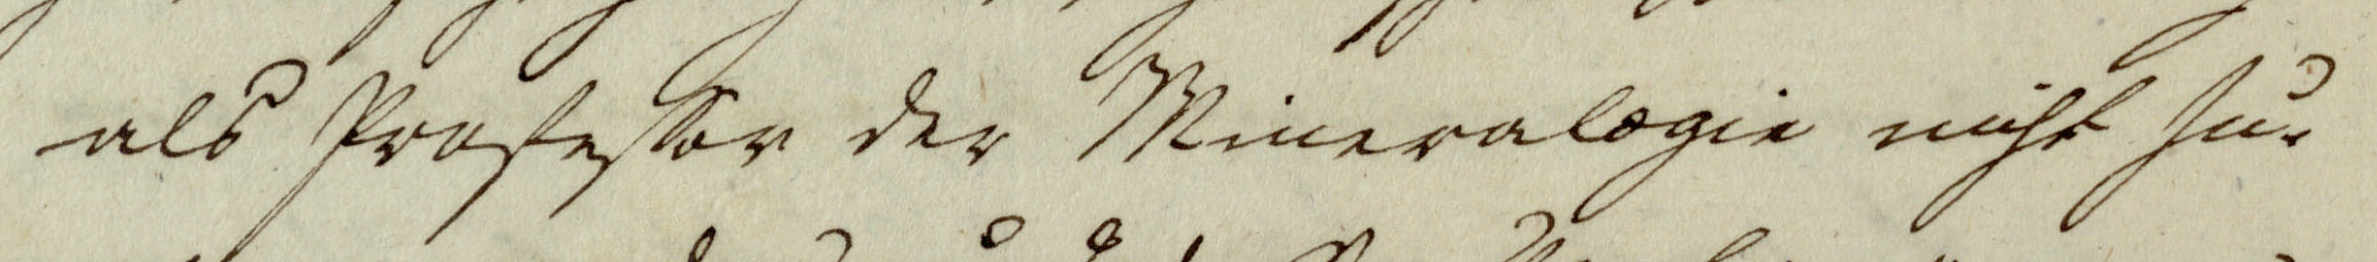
als Professor der Mineralogie nicht zu¬
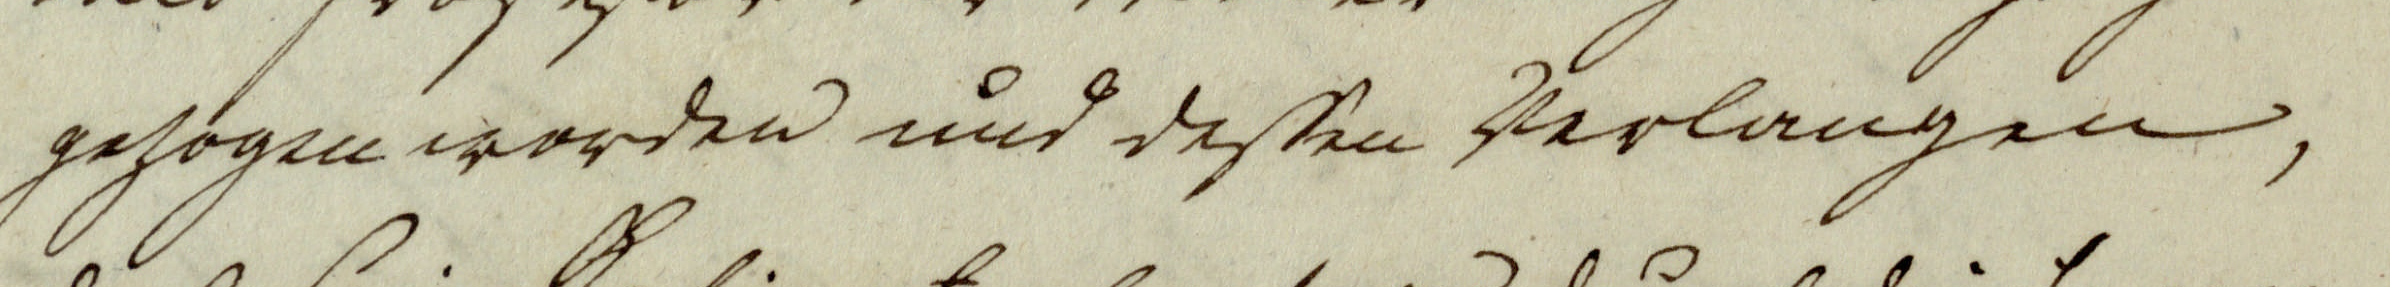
gezogen worden und dessen Verlangen,
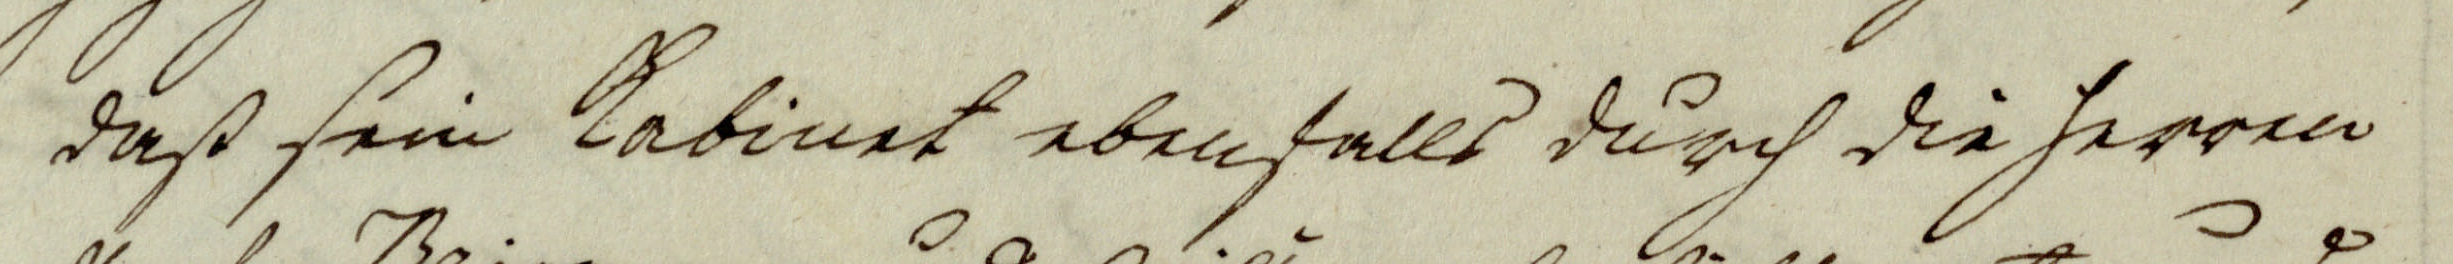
daß sein Kabinet ebenfalls durch die Herren
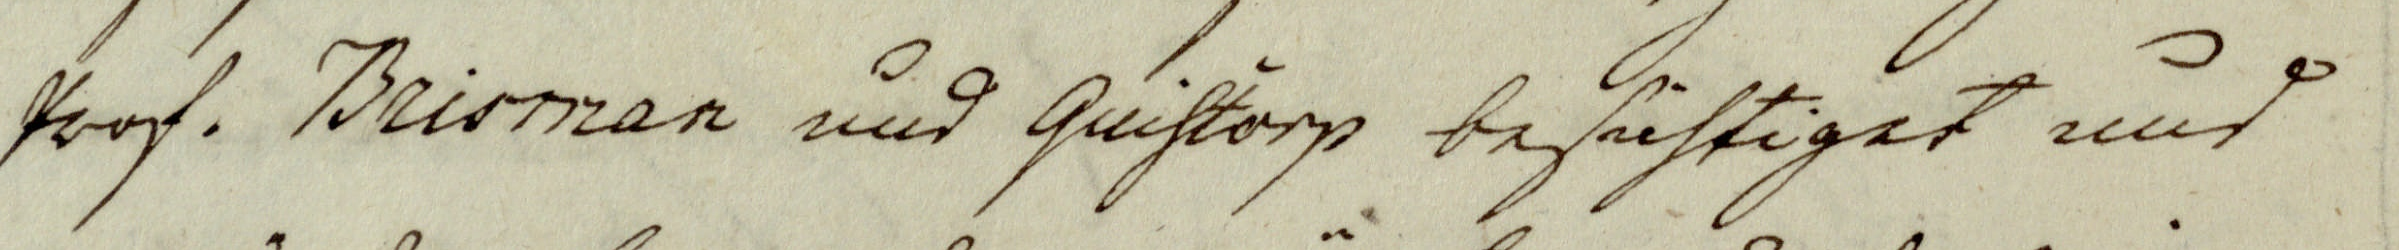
Prof. Brisman und Quistorp besichtiget und
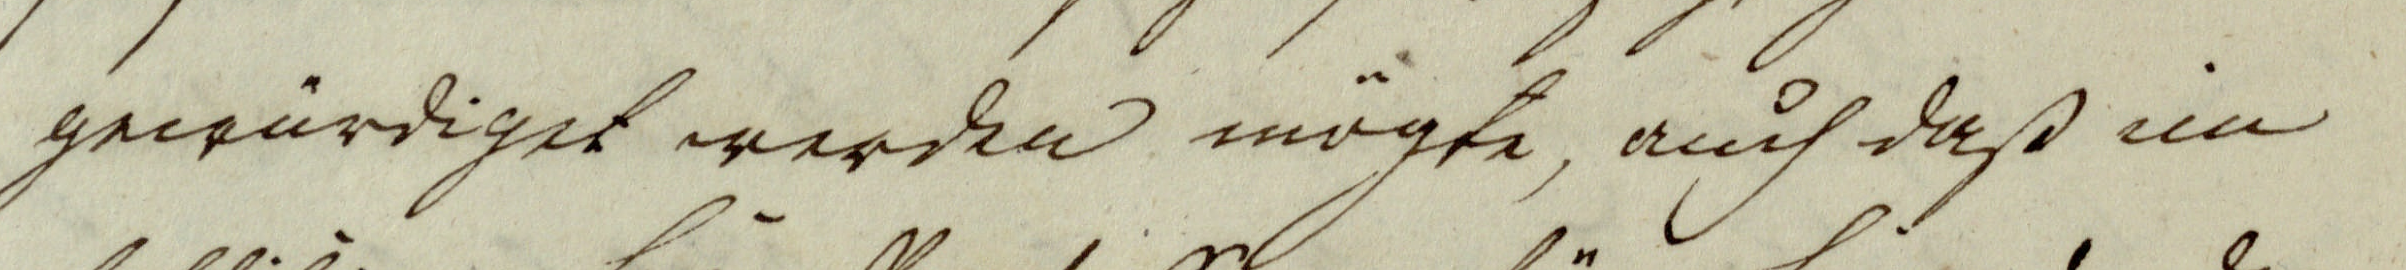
gewürdiget werden mögte, auch daß im
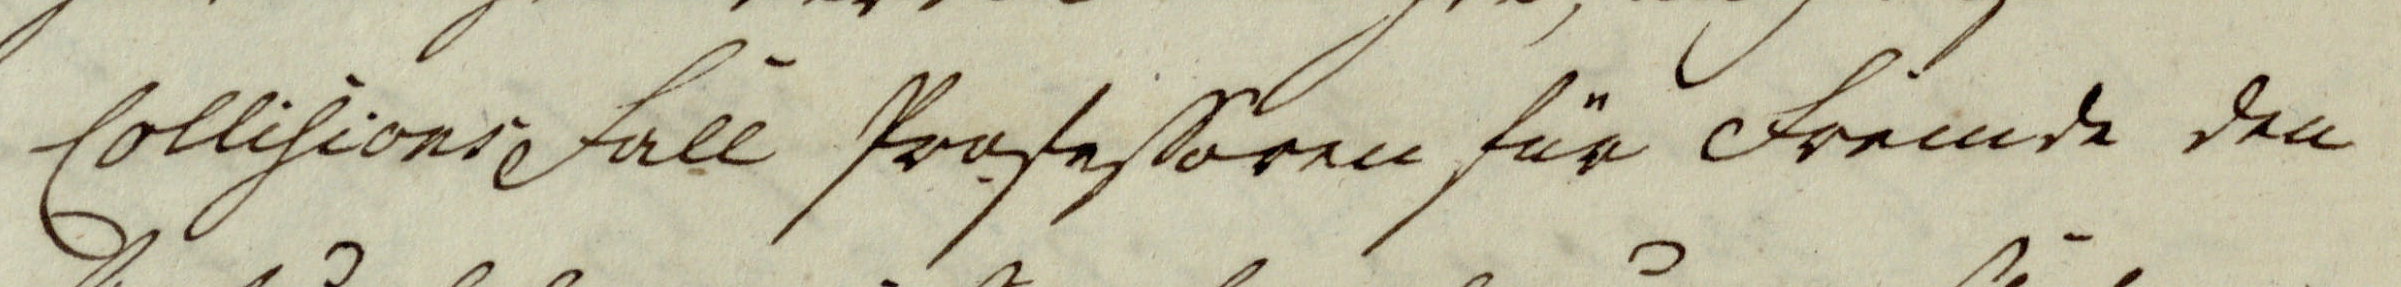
Collisions Fall Professoren für Fremde den
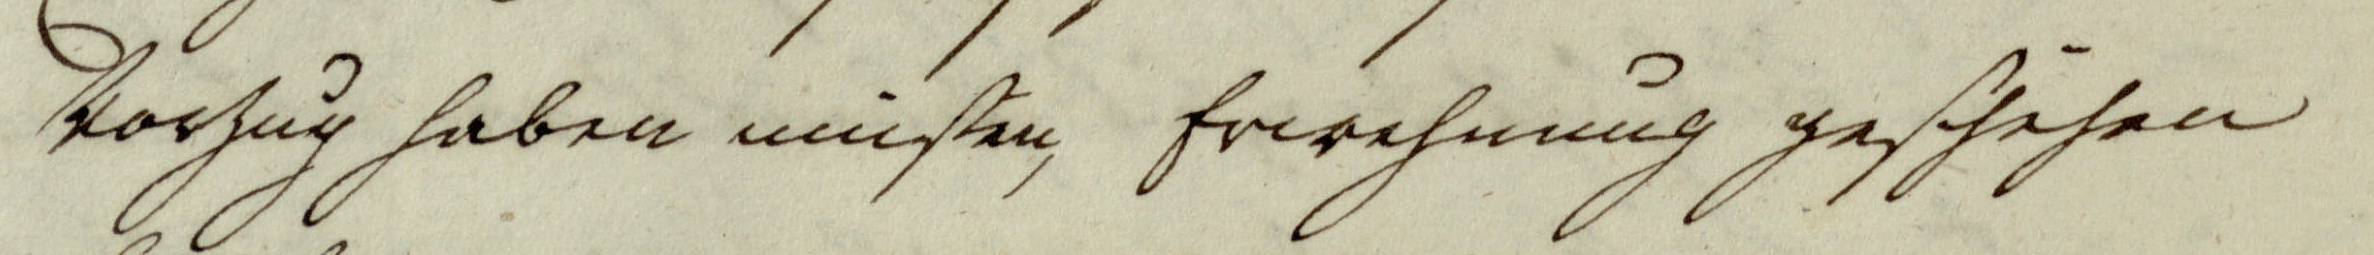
Vorzug haben müßten, Erwehnung geschehen
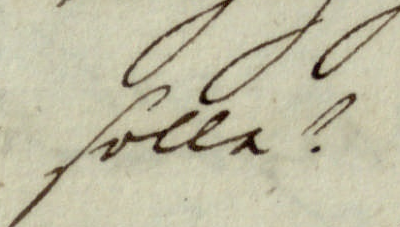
solle.
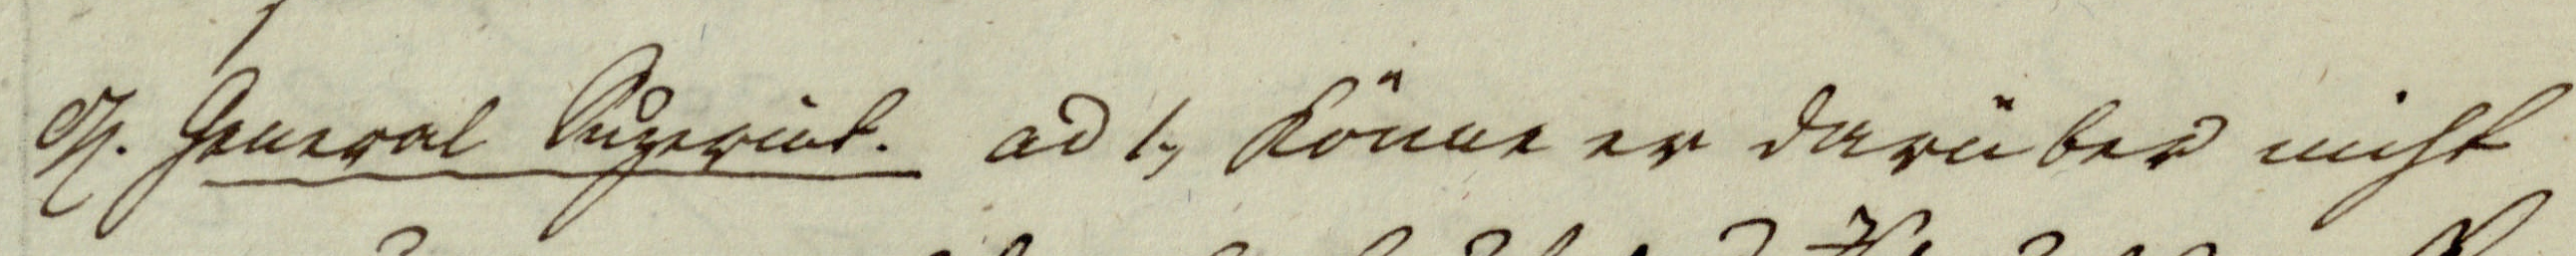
dh. General Superint. ad 1., könne er darüber nicht
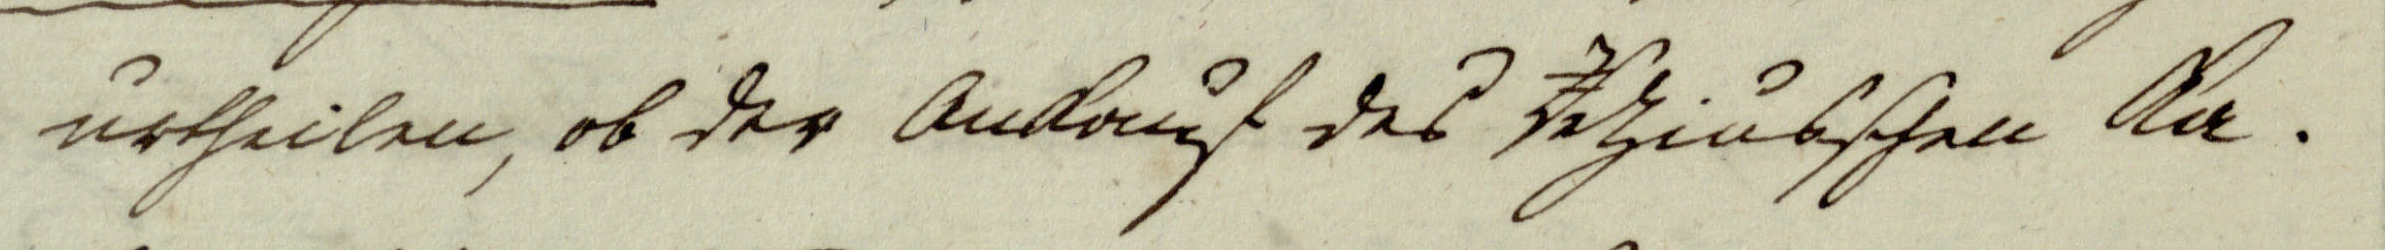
urtheilen, ob der Ankauf des Reziusschen Ka¬
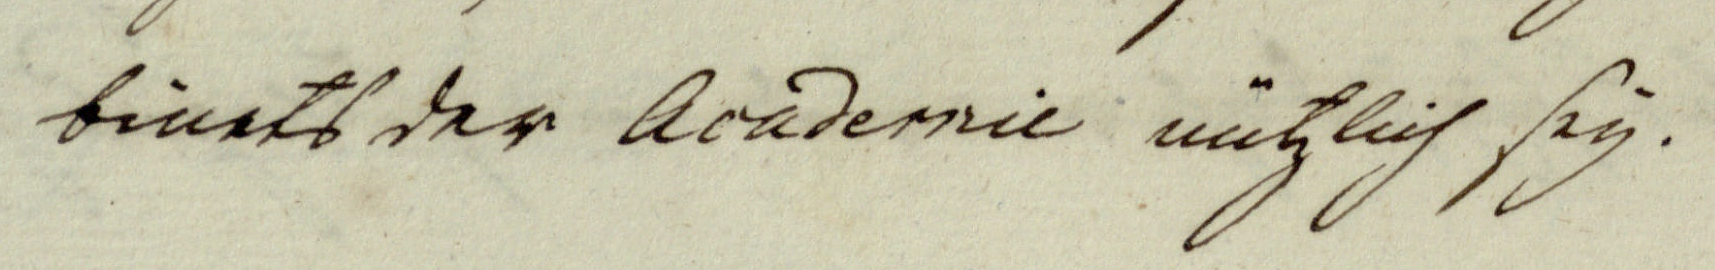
binets der Academie nützlich seÿ.
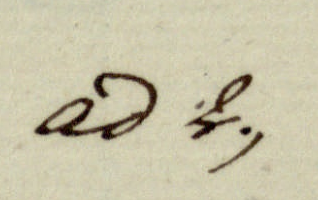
ad 2.,
